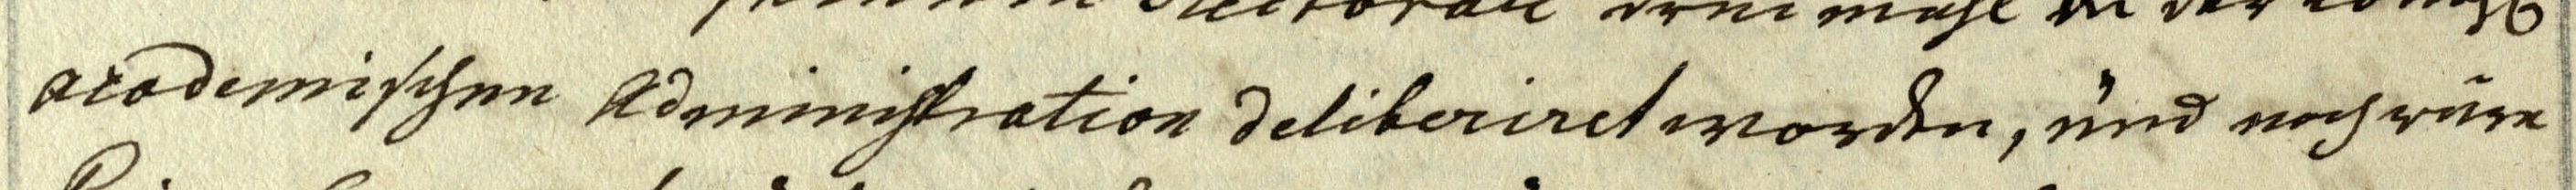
Academischen Administration deliberiret worden, und noch wäre
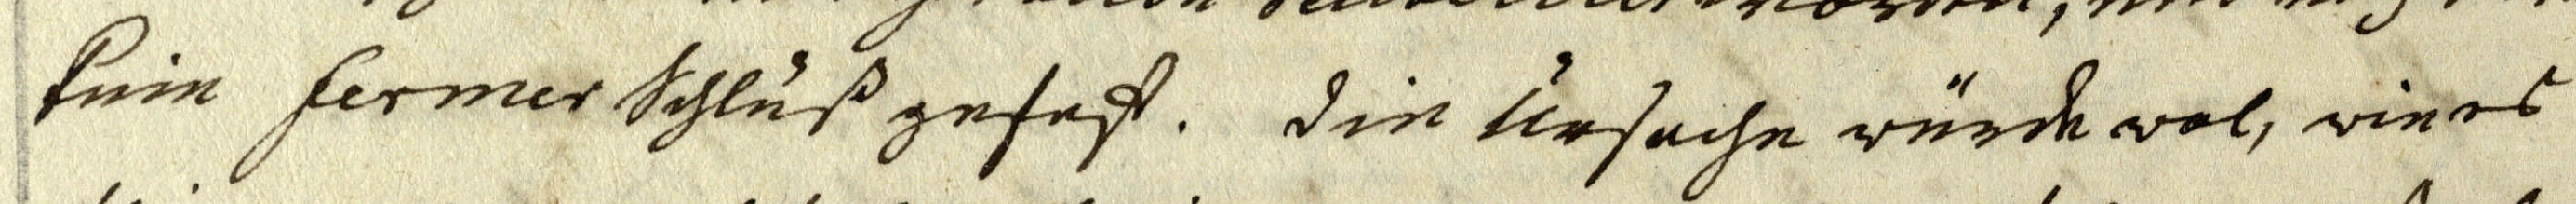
kein fermer Schluß gefast. Die Ursache würde wol, wie es
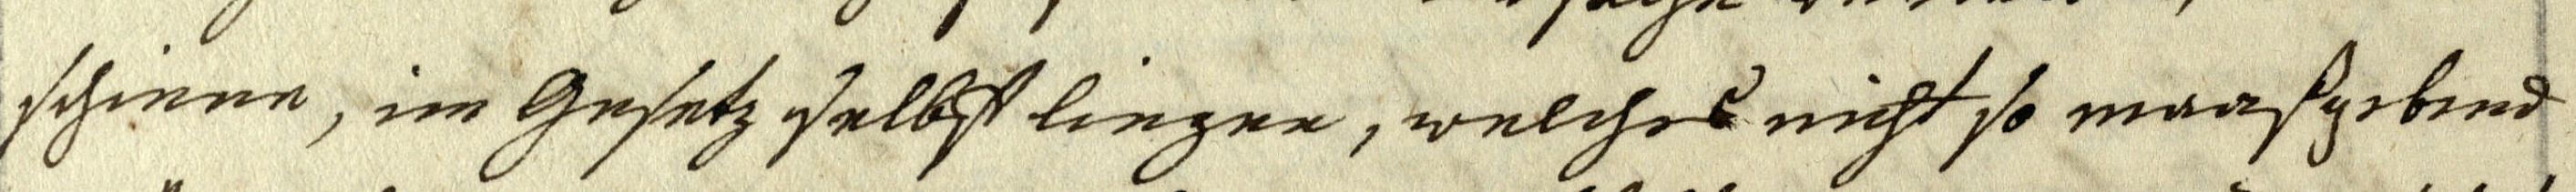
schiene, im Gesetz selbst liegen, welches nicht so maaßgebend
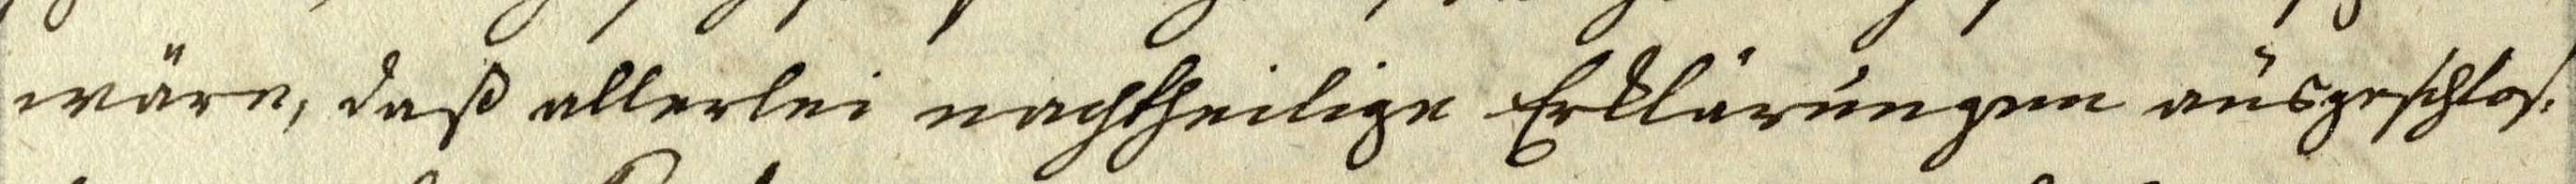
wäre, daß allerlei nachtheilige Erklärungen ausgeschlos¬
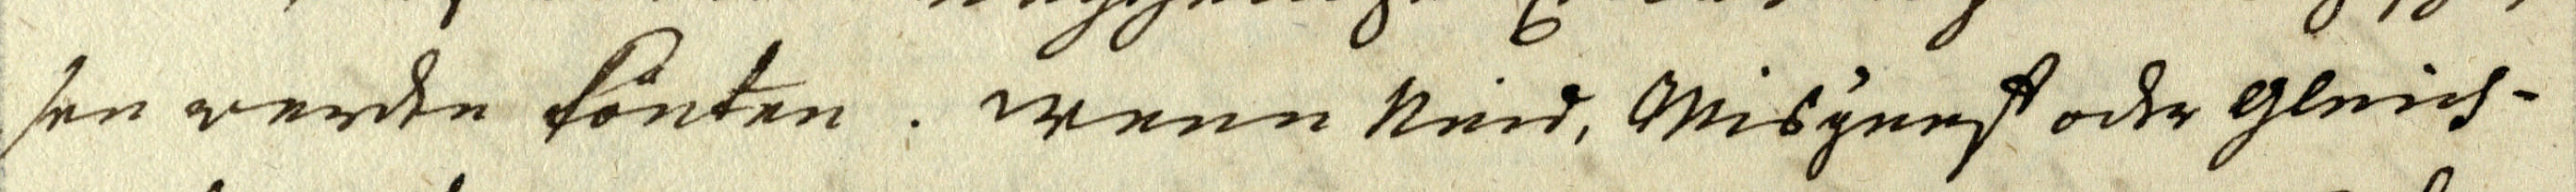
sen werden könten. Wenn Neid, Misgunst oder Gleich¬
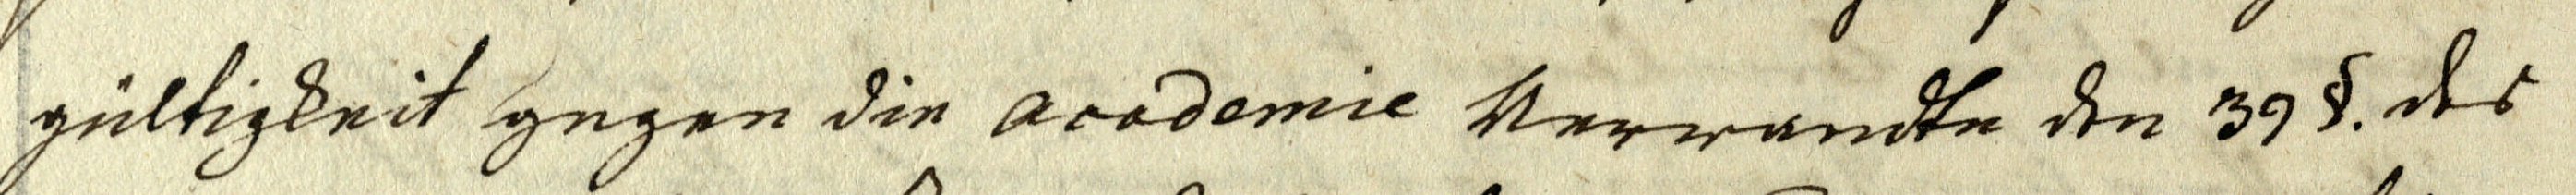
gültigkeit gegen die Academie Verwandte den 39 §. des
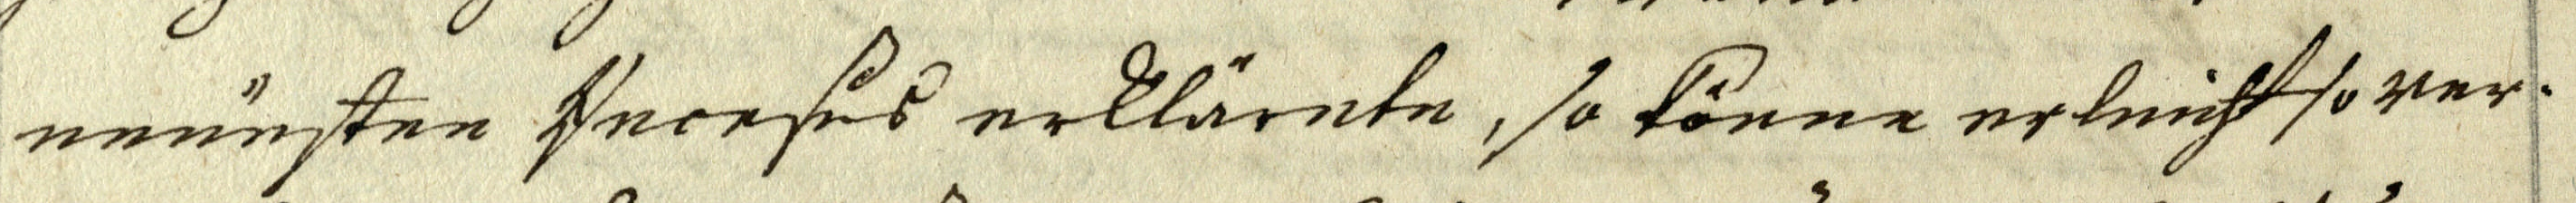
neuesten Receßes erklärete, so könne er leicht so ver¬
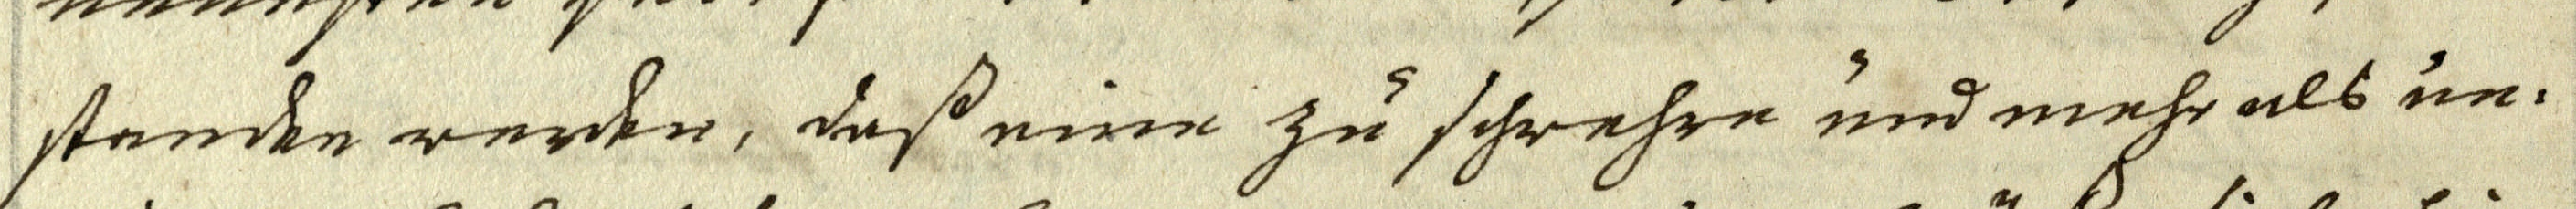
standen werden, daß eine zu schwehre und mehr als un¬
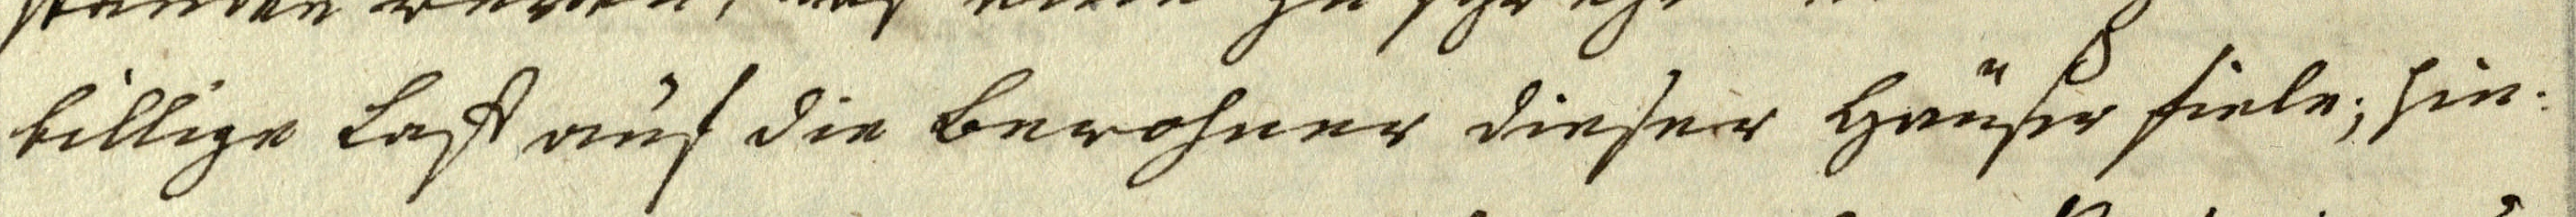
billige Last auf die Bewohner dieser Häuser fiele; hin¬
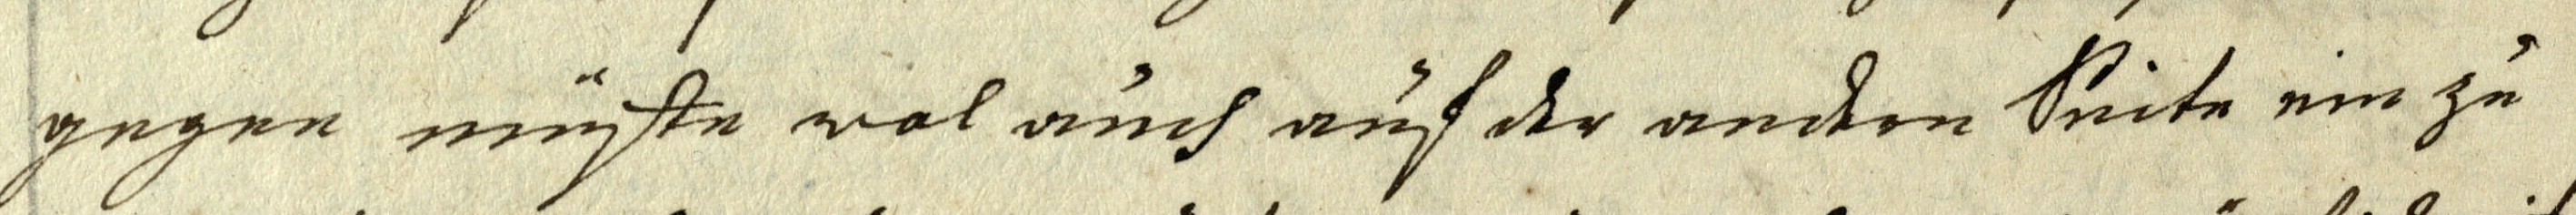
gegen müste wohl auch auf der andern Seite ein zu
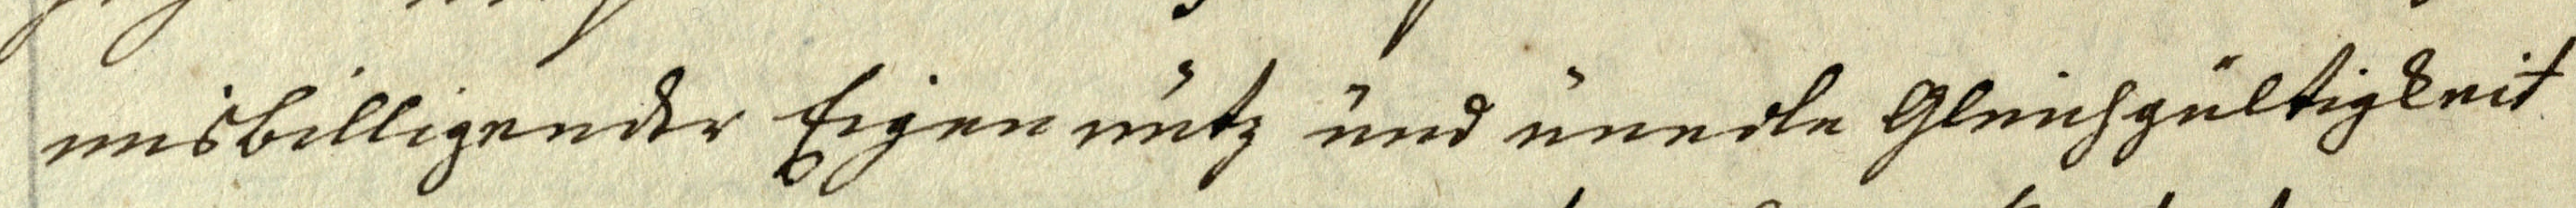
misbilligender Eigennutz und unedle Gleichgültigkeit
